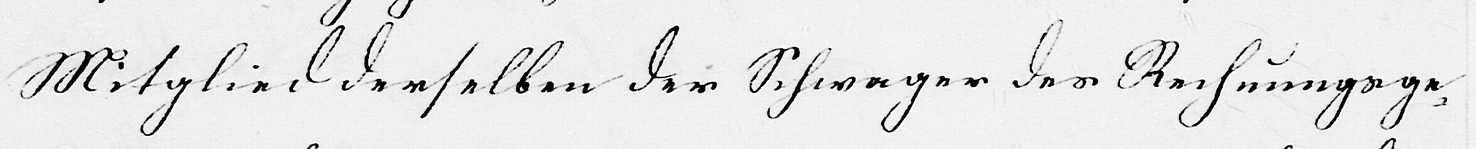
Mitglied derselben der Schwager des Rechnungsge¬
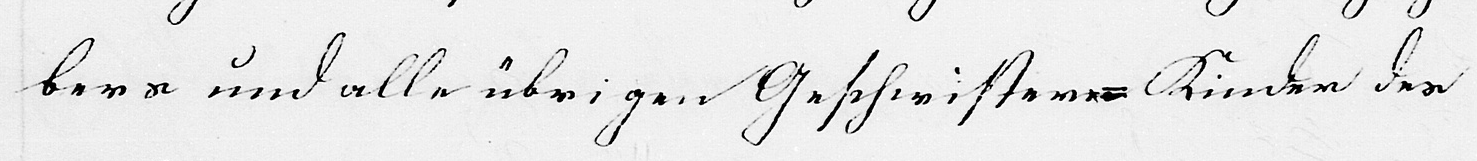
bers und alle übrigen Geschwister-Kinder des
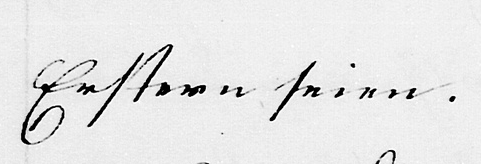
Erstern seien.
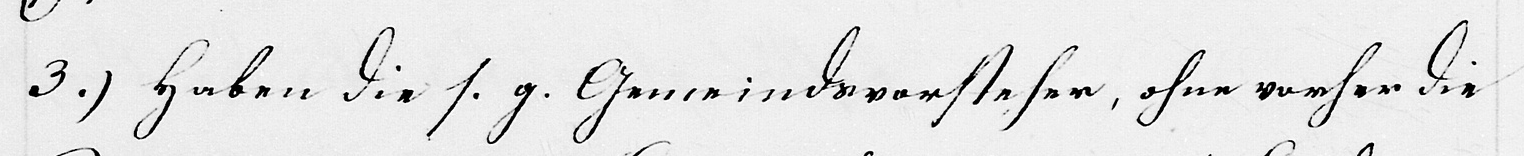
3.) Haben die s. g. Gemeindsvorsteher, ohne vorher die
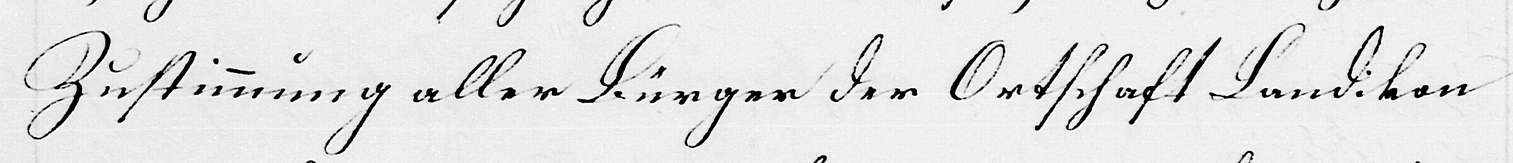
Zustimmung aller Bürger der Ortschaft Landikon
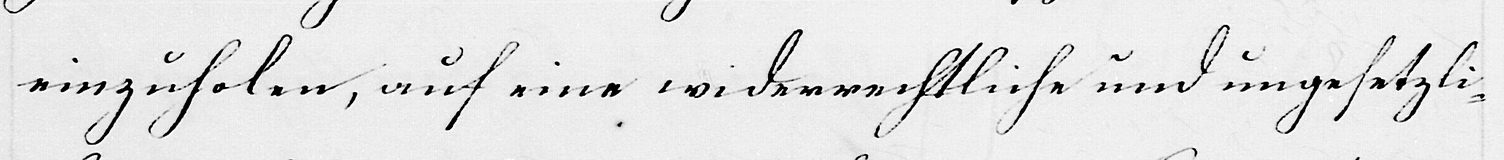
einzuholen, auf eine widerrechtliche und ungesetzli¬
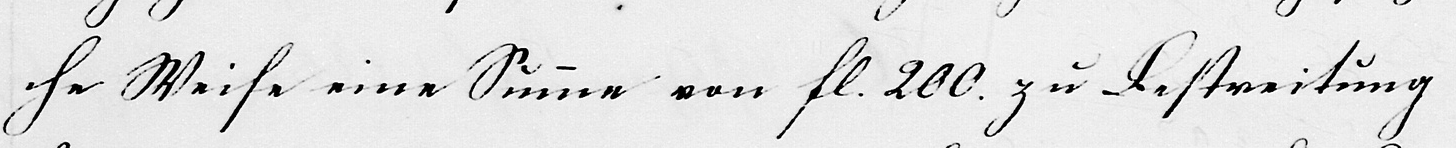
che Weise eine Summe von fl. 200. zu Bestreitung
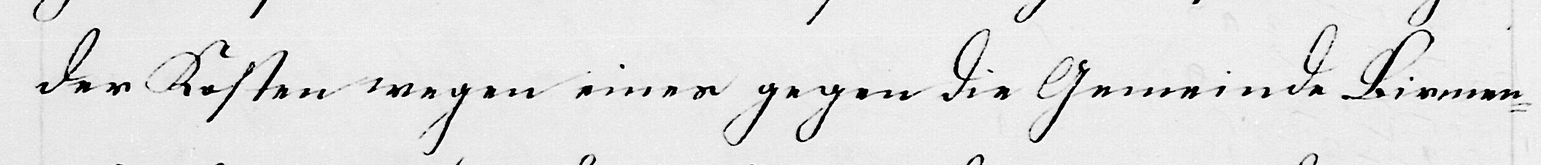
der Kosten wegen eines gegen die Gemeinde Birmen¬
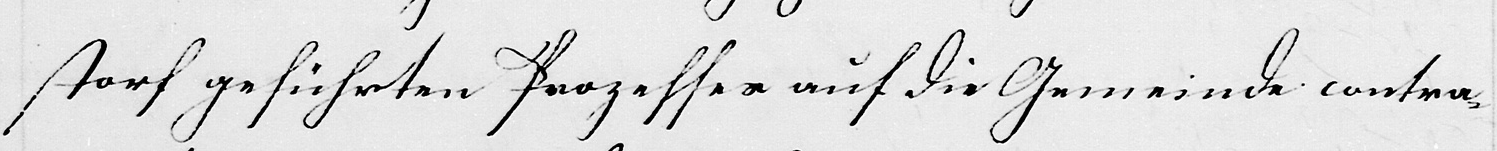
storf geführten Prozesses auf die Gemeinde contra¬
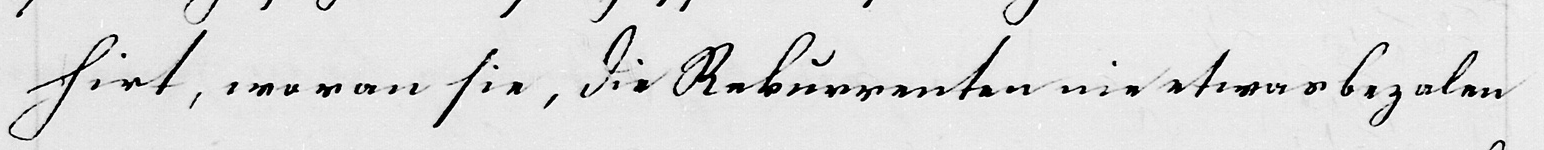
hirt, woran sie, die Rekurrenten nie etwas bezahlen
